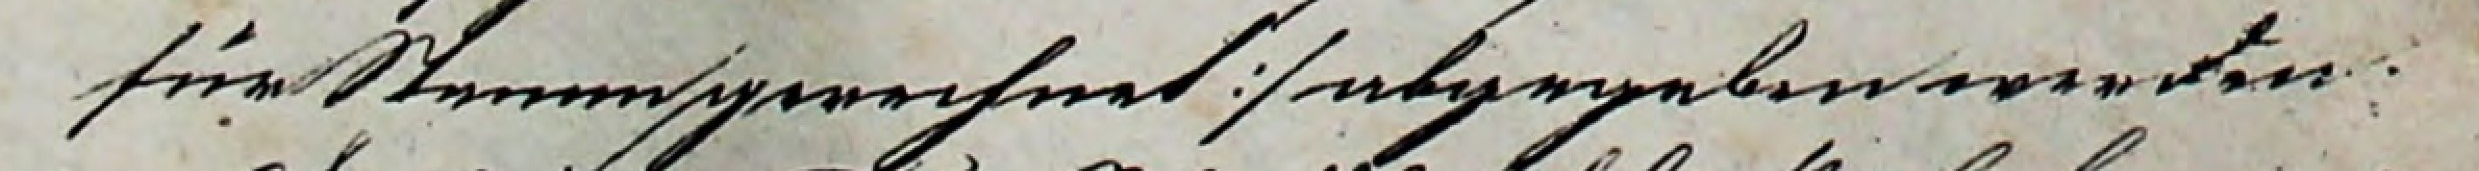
für Stamm gerechnet:/ abgegeben werden
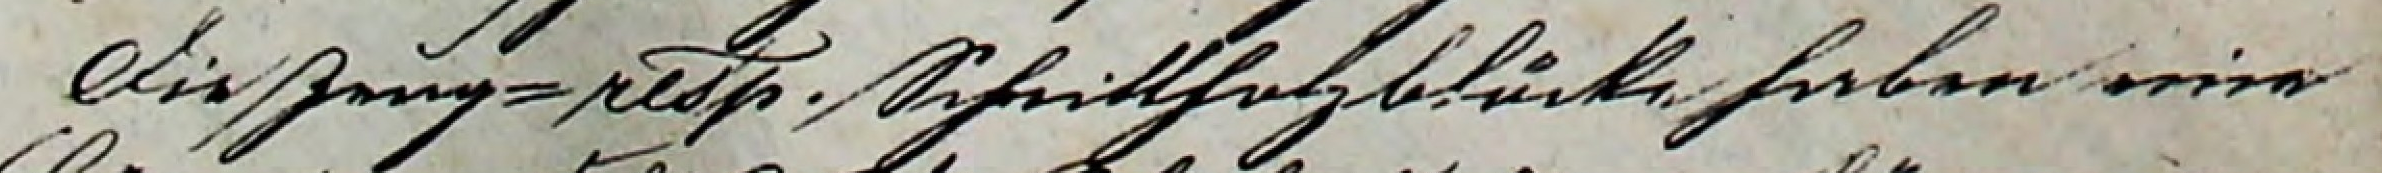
Die Zeug = resp. Schnittholz Blöcke haben eine
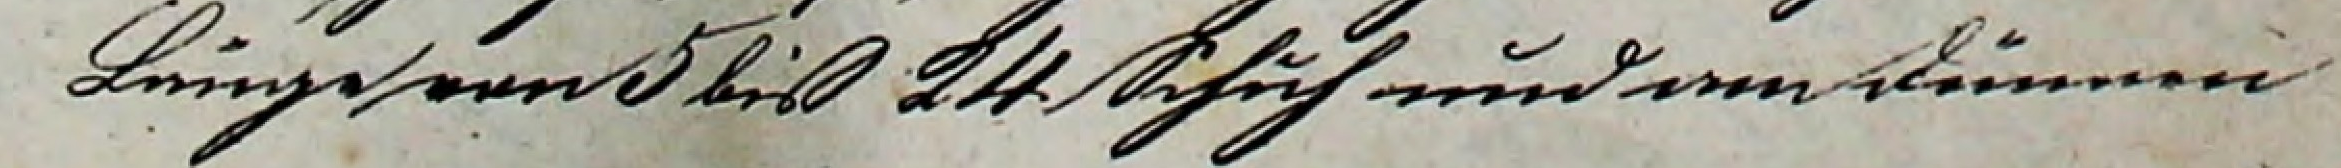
Lauge von 5 bis 24. Schuh und am Dunnen
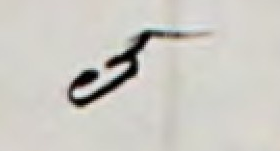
5
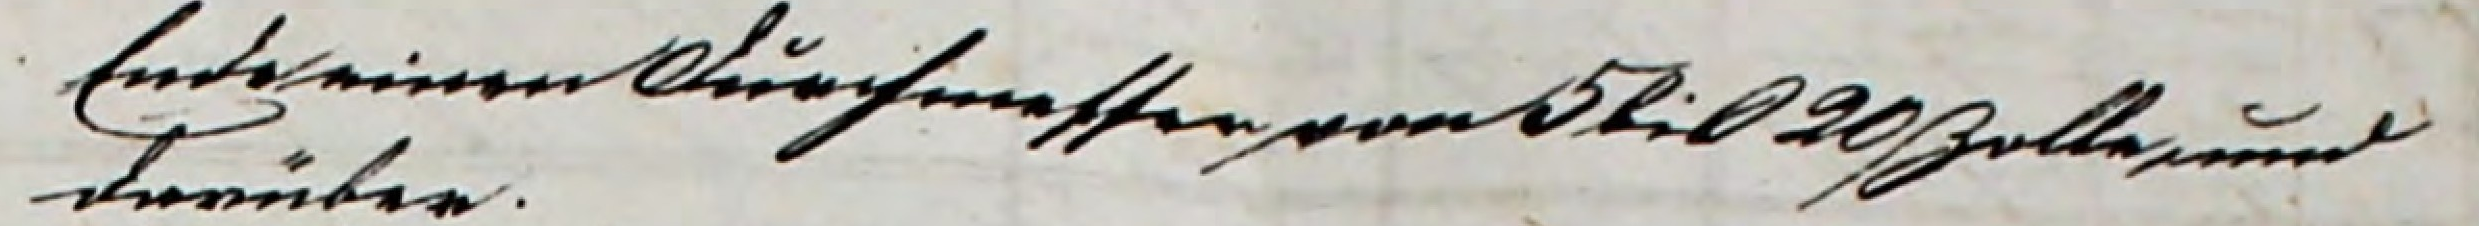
Ende einen Durchmessen von 5 bis 20 Zolle und
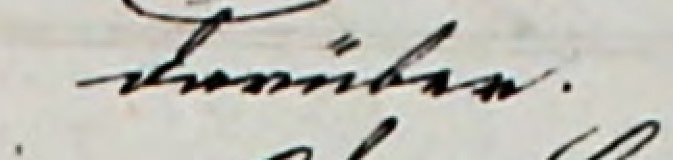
darüber.
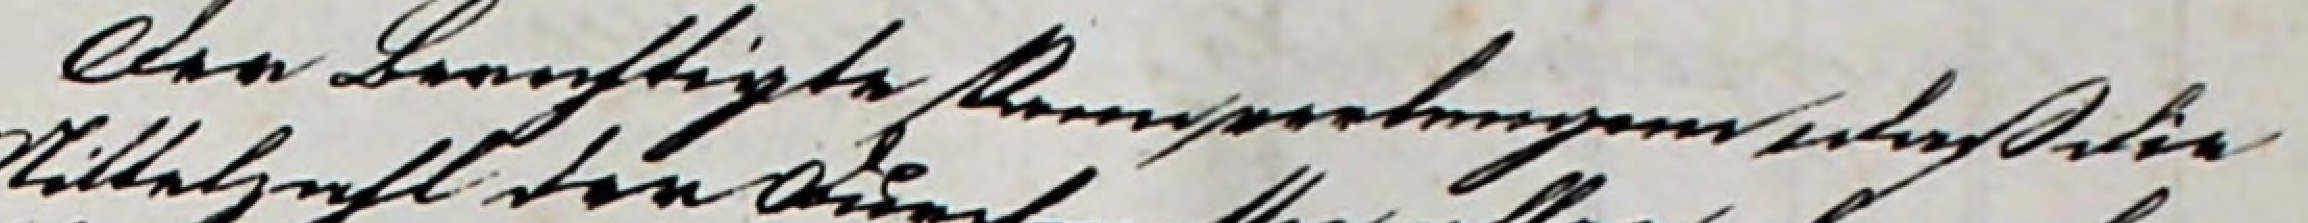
Der Bernhtigte Renn verbengem ?daß die
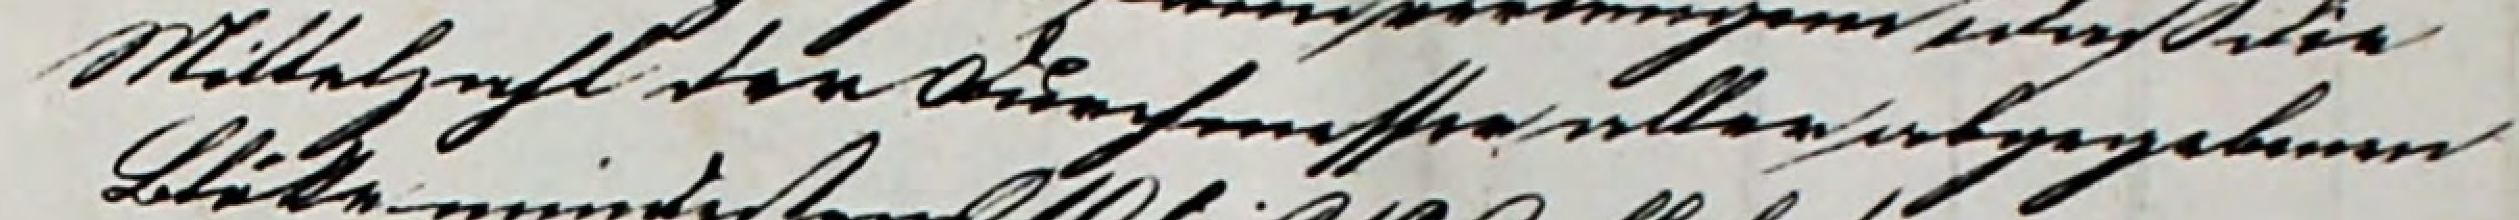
Mittelzahl der Durchmesser aller abgegebenen
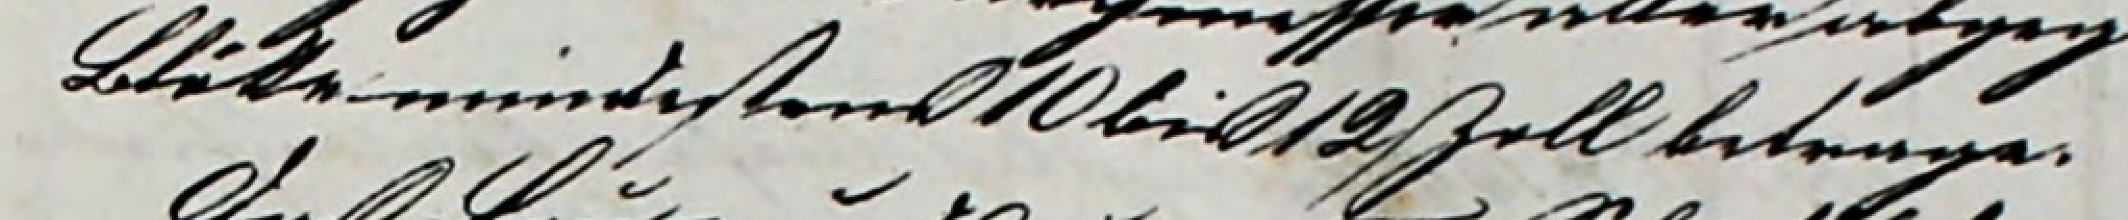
Blöke mindestens 10 bis 12 Zoll betrage.
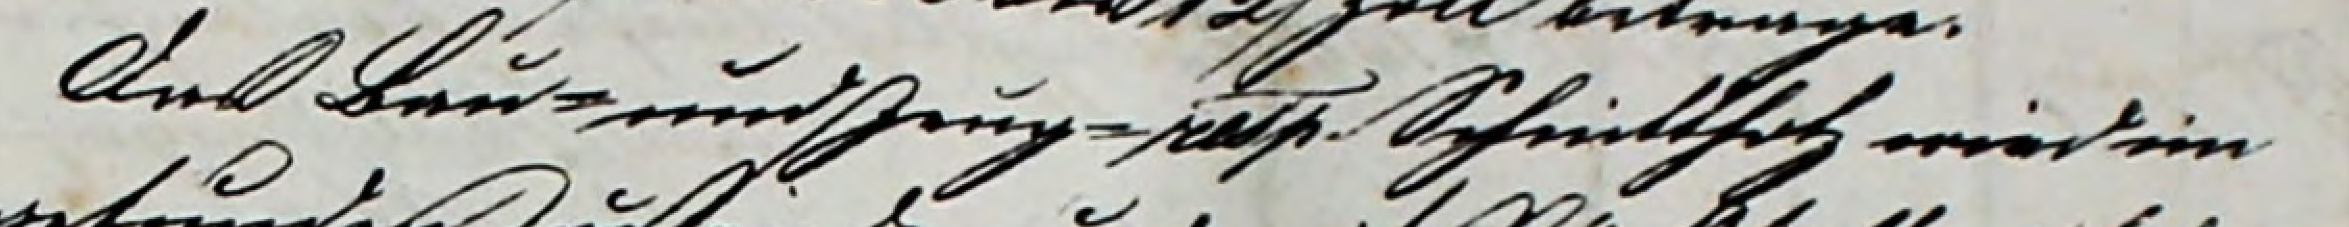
Das Bau = und Zeug = resp. Schnittholz wird im
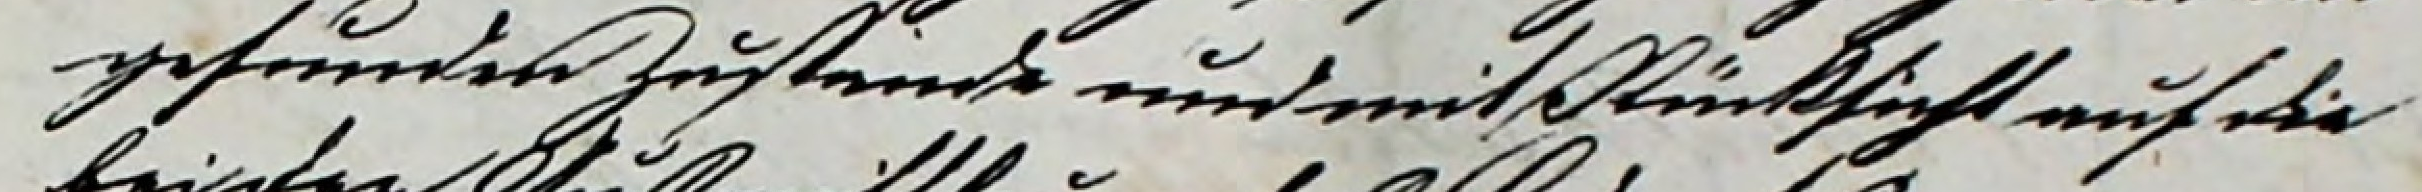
gesunden Zustünde und mit Rücksicht auf die
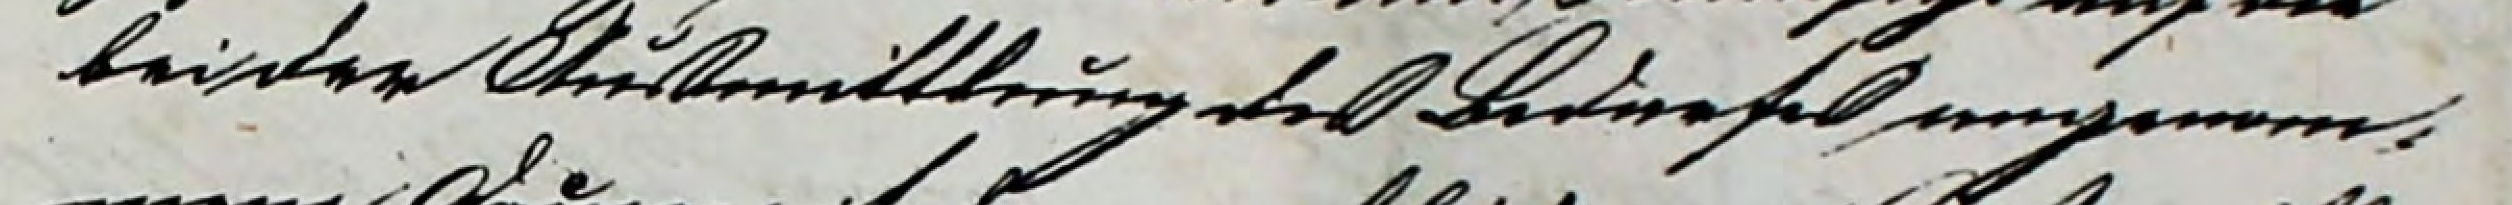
bei der Ausmittlung des Bedarfes angenom„
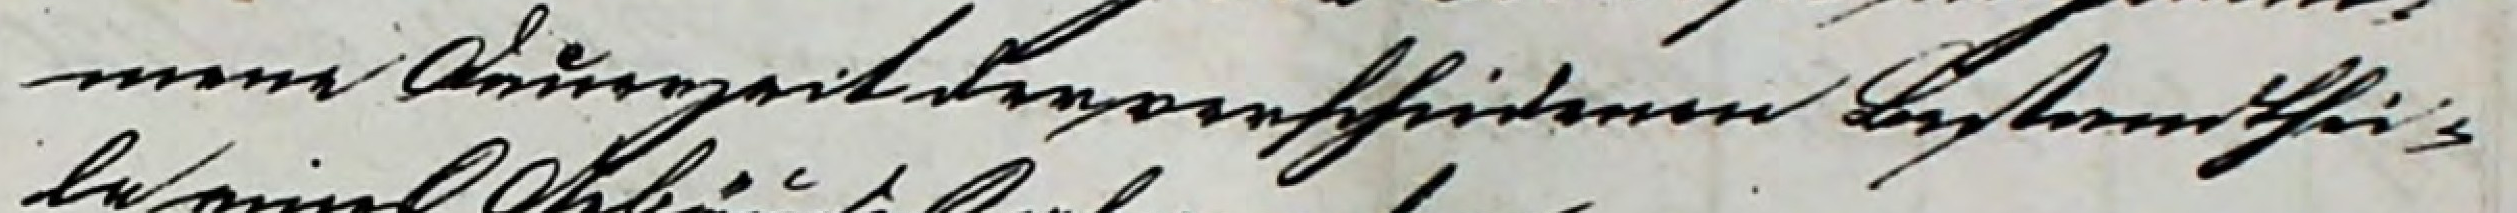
mene Dauerzeit der verschiedenen Bestandthei„
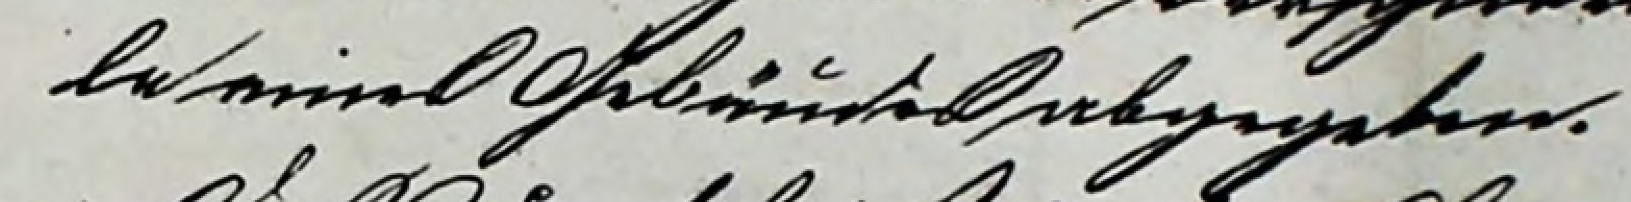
le eines Gebäudes abgegeben.
